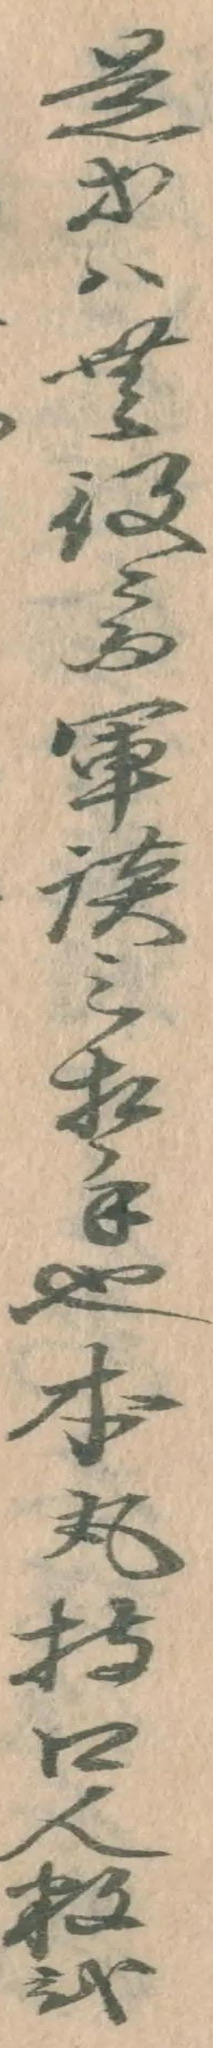是等は無役に而軍談之相手也本丸持口人数越
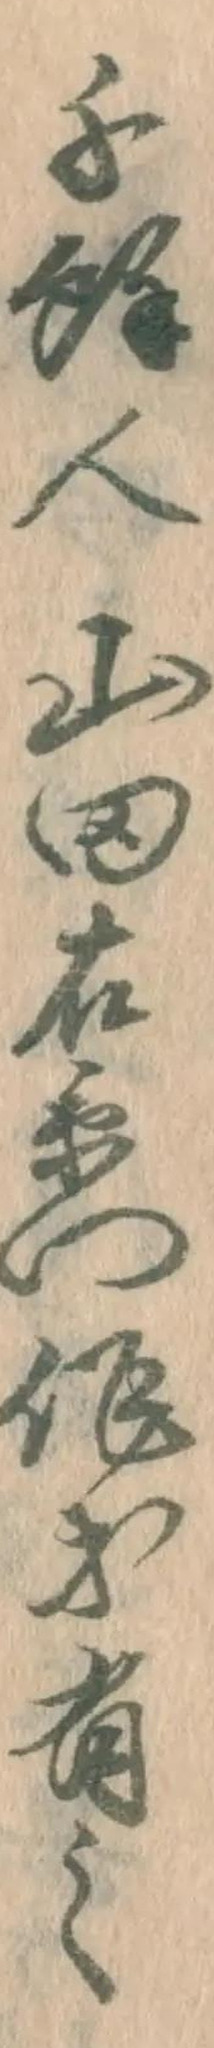千余人山田右衛門作等有之
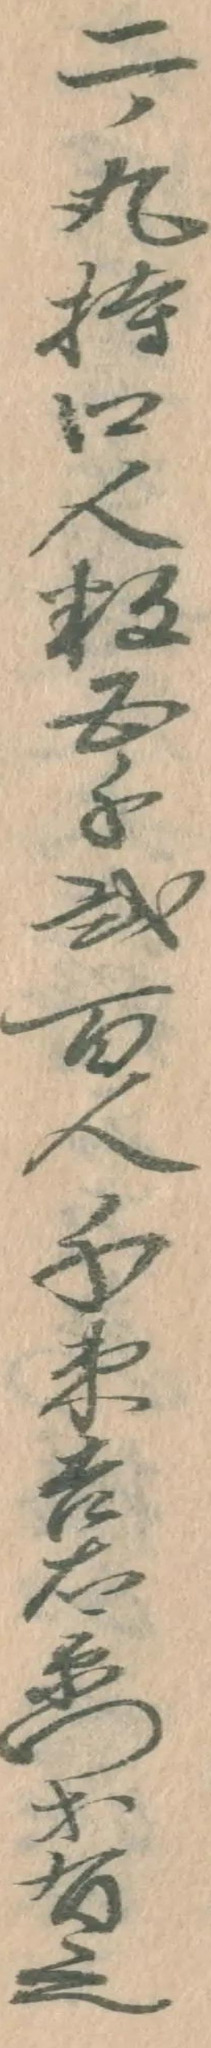二之丸持口人数五千弐百人千束吉右衛門等有之
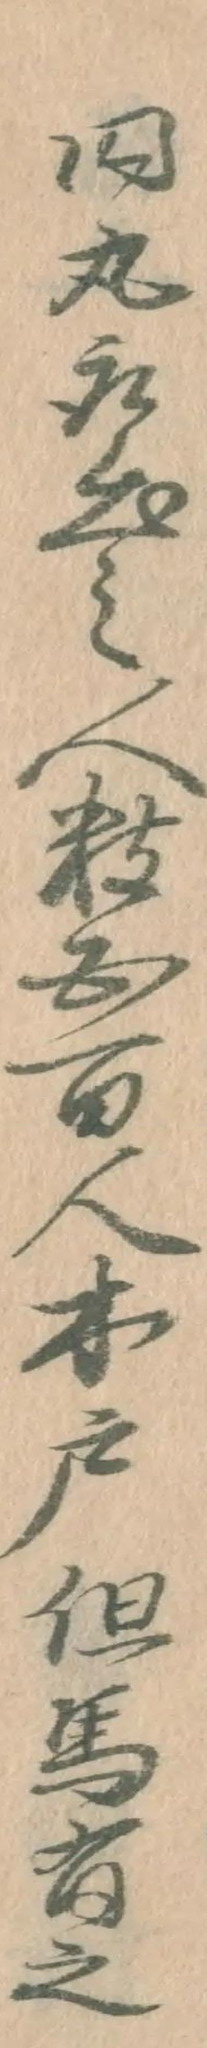同丸取出し人数五百人木戸但馬有之
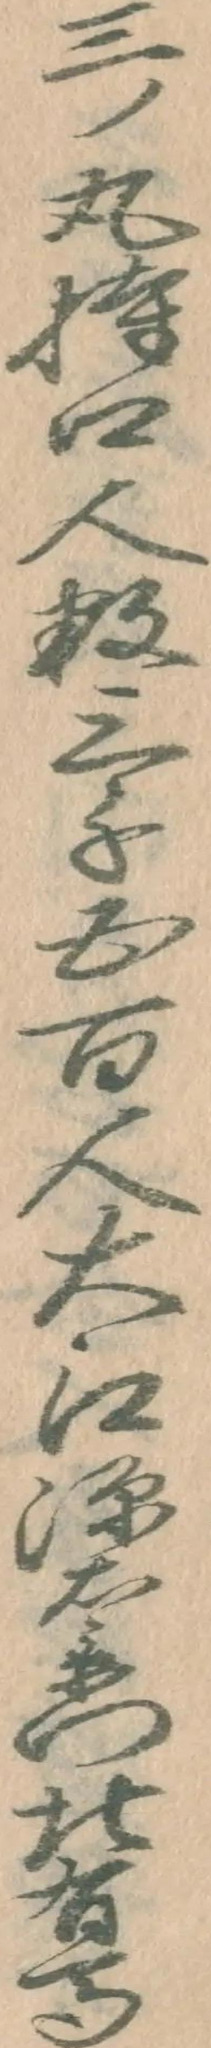三之丸持口人数三千五百人大江源右衛門北有馬

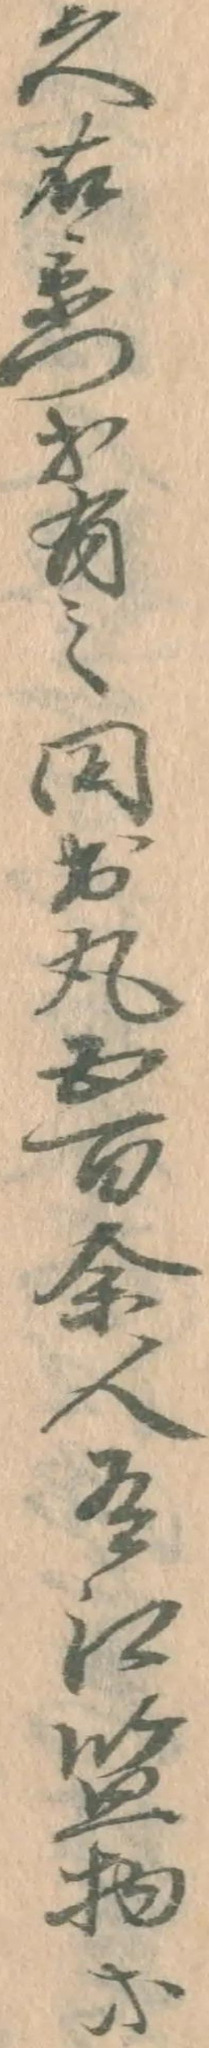久右衛門等有之同出丸五百余人有江監物等
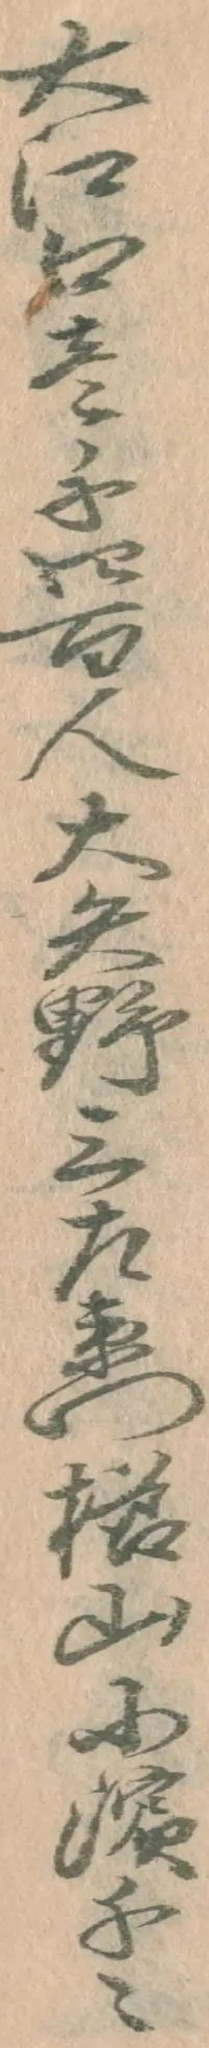大江口壱千四百人大矢野三左衛門櫛山小浜千々
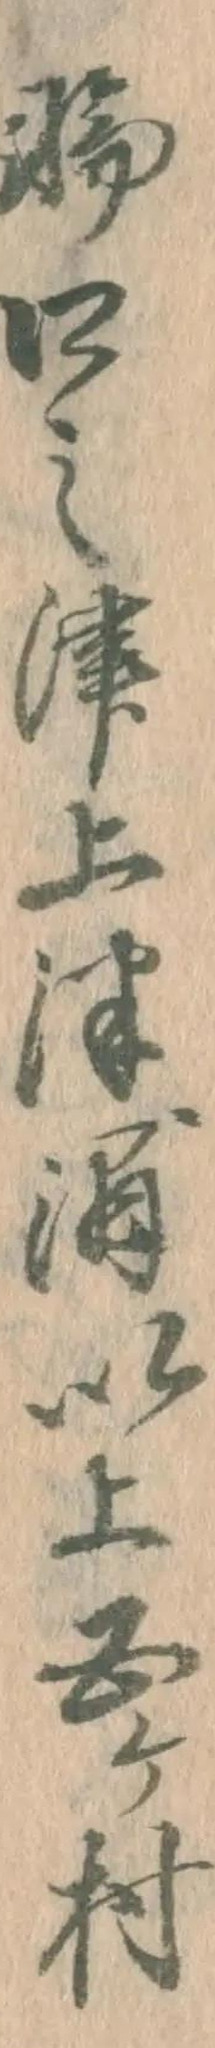輪口之津上津浦以上五け村
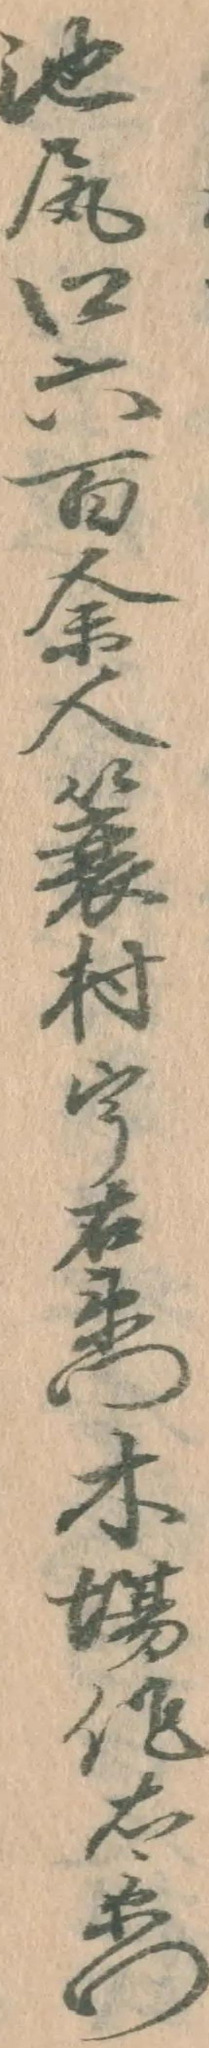池尻口六百余人蓑村宇右衛門木場作右衛門
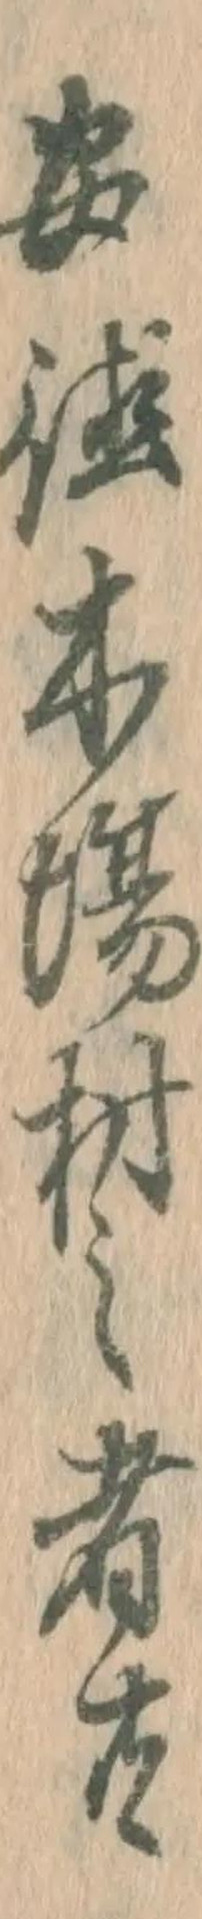安徳木場村之者共
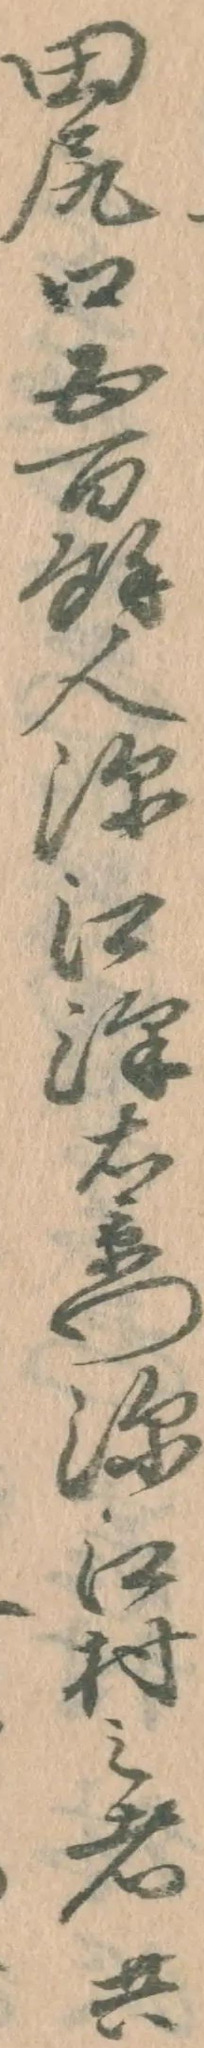田尻口五百余人深江沢右衛門深江村之者共
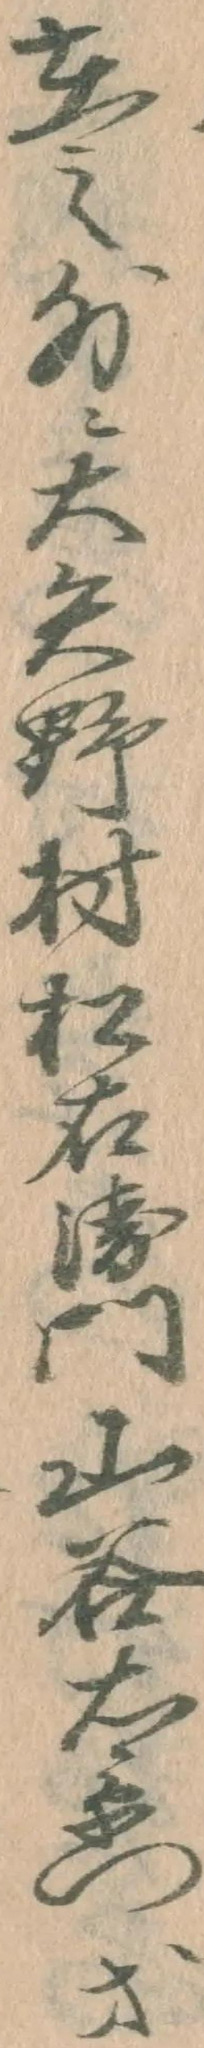在之外に大矢野村松右衛門山谷右衛門等
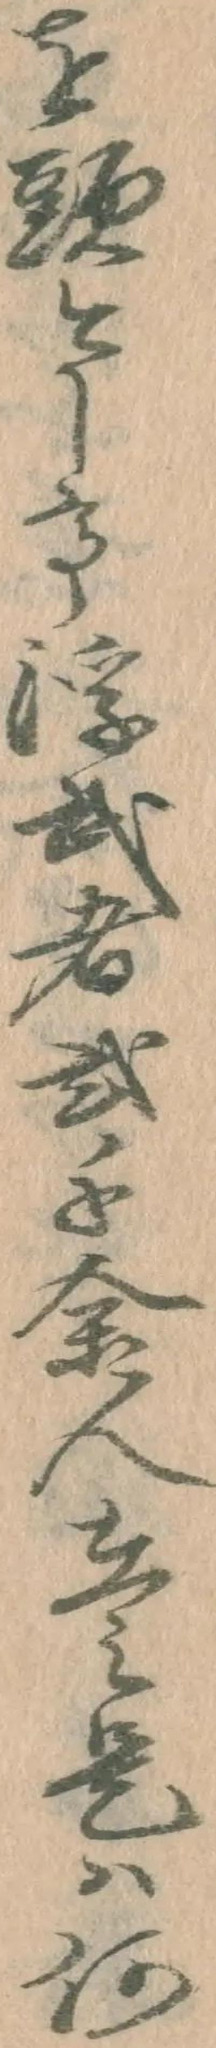を頭とし亭浮武者弐千余人在之是は何
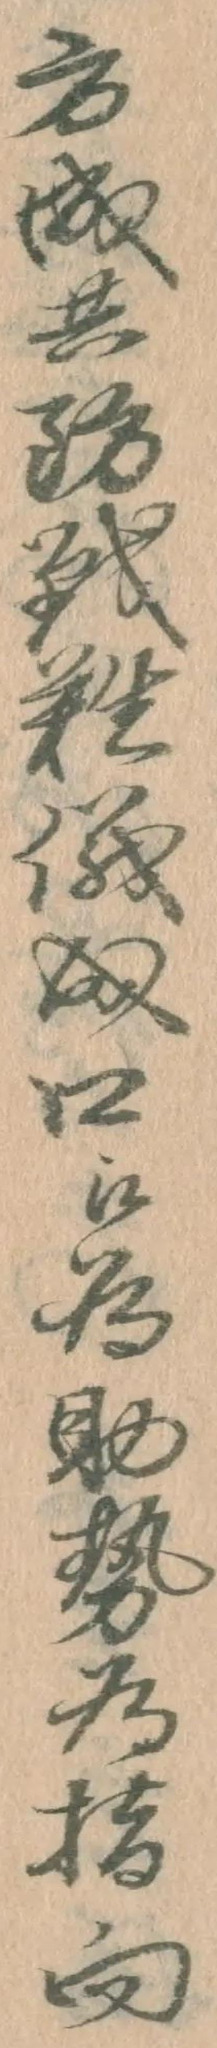方成共防戦難儀成口江為助勢為指向
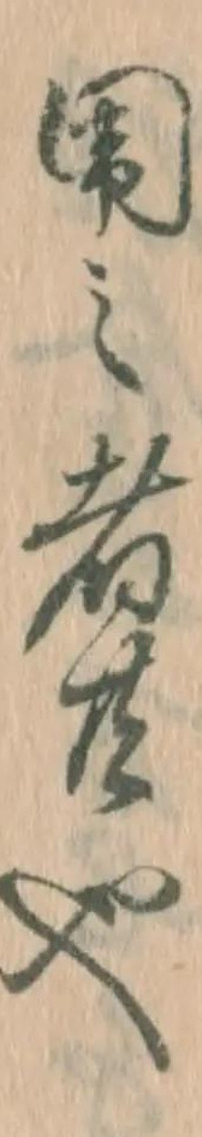用之者共也
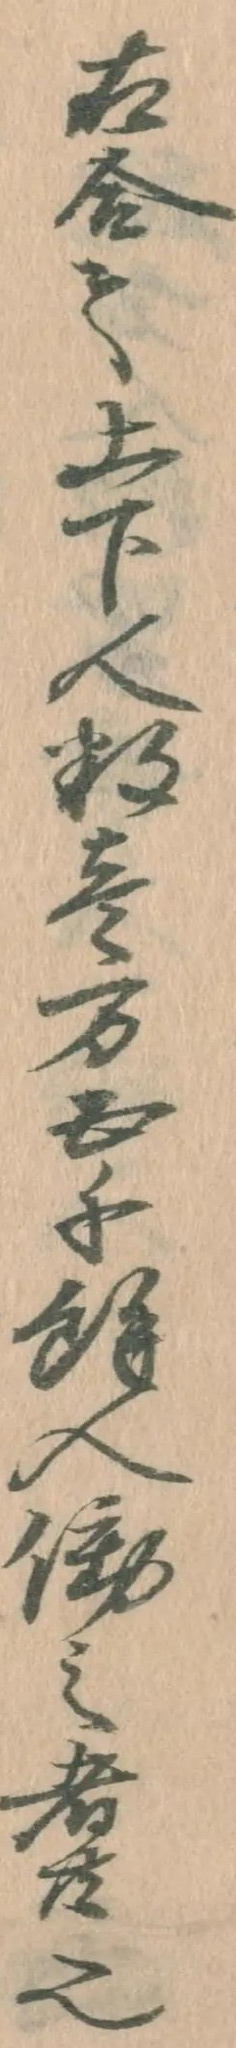右合て上下人数壱万五千余人働之者共也
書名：切支丹御退治記 49巻. [4]
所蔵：国立国会図書館 National Diet Library, JAPAN
